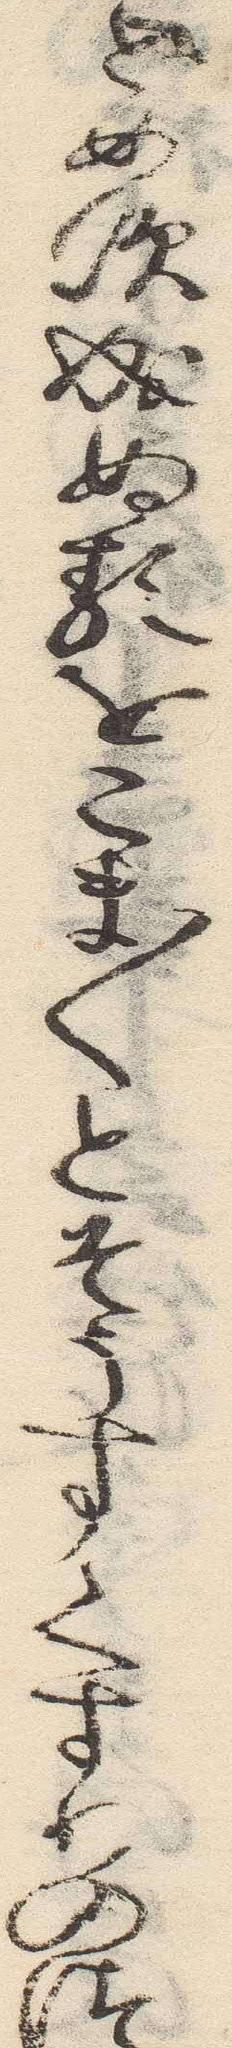どめす成ぬるをこま〳〵とそうすくすりのつ
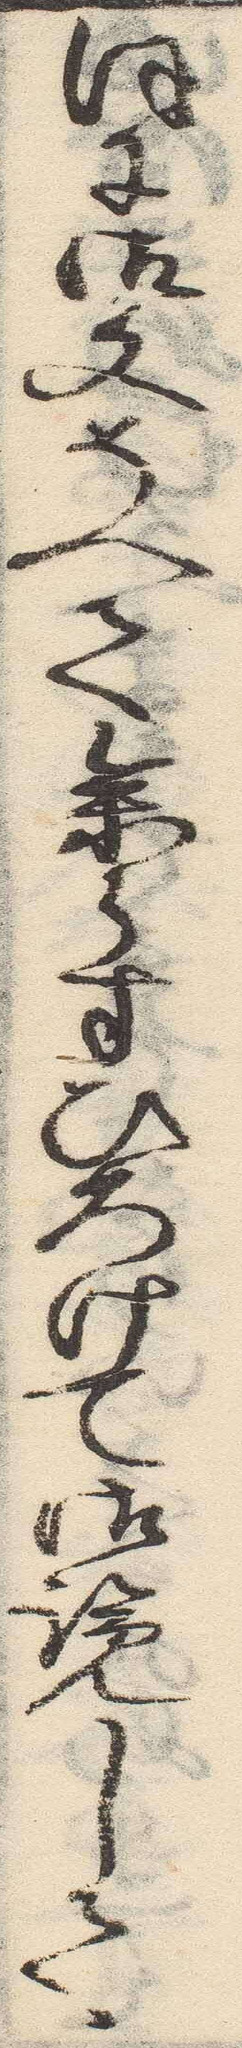ほに御文そへて参らすひろけて御覧して
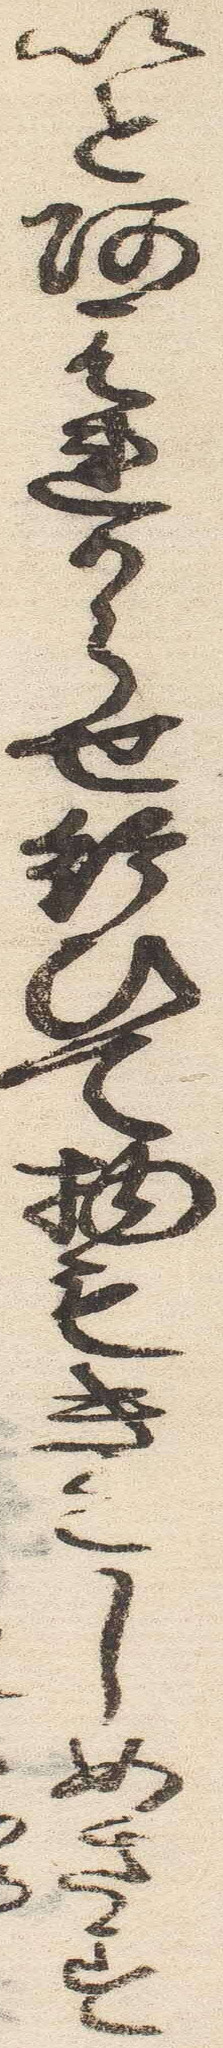いとあはれからせ給ひて物もきこしめさす
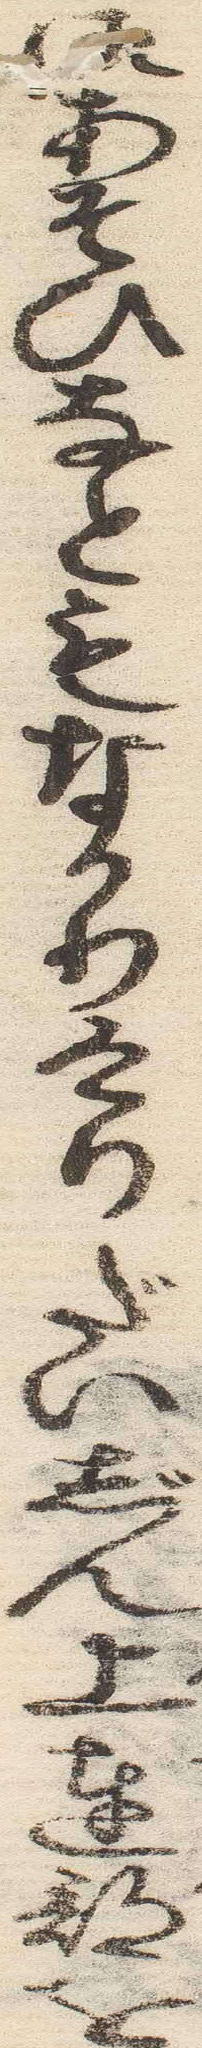御あそひなともなかりけりだいじん上達部を
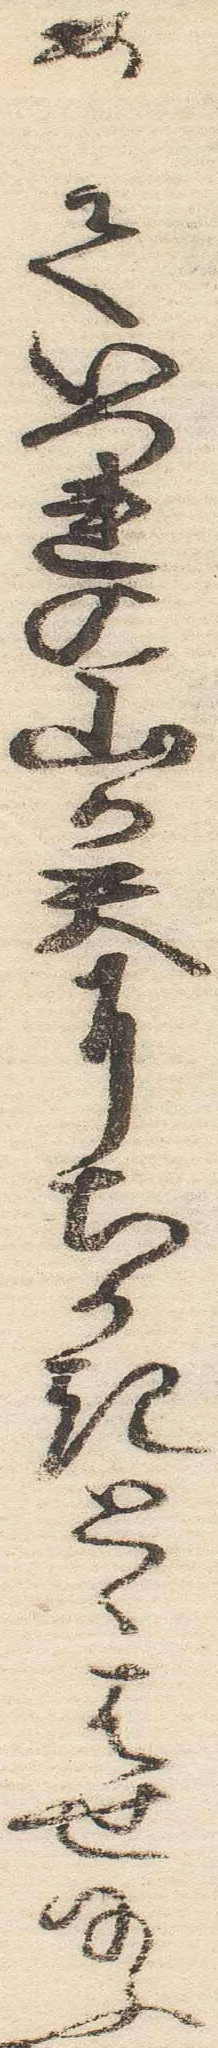めていつれの山か天にちかきとゝはせ給ふ
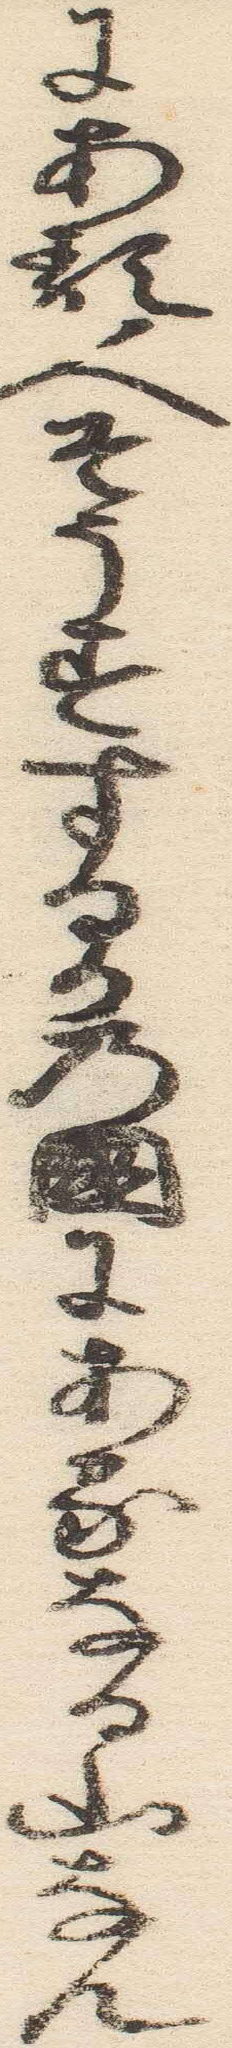にある人そうすするかの国にあるなる山なん
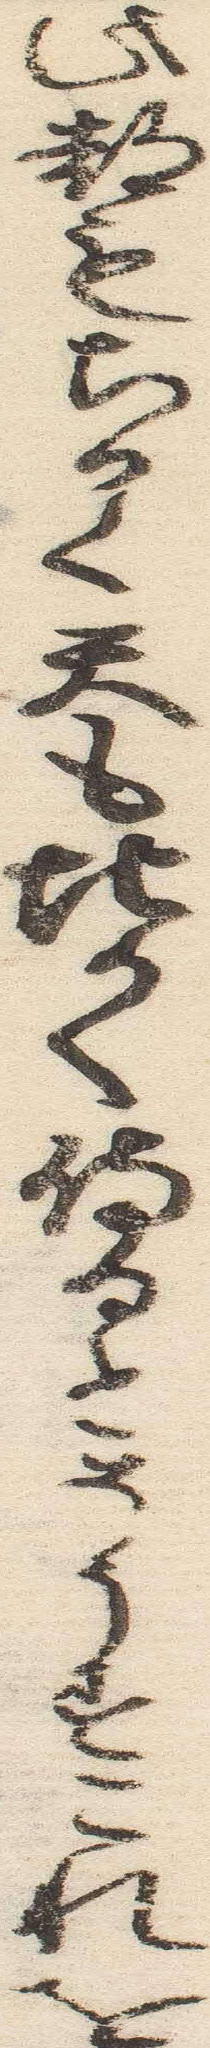此都もちかく天もちかく侍るとそうすこれを
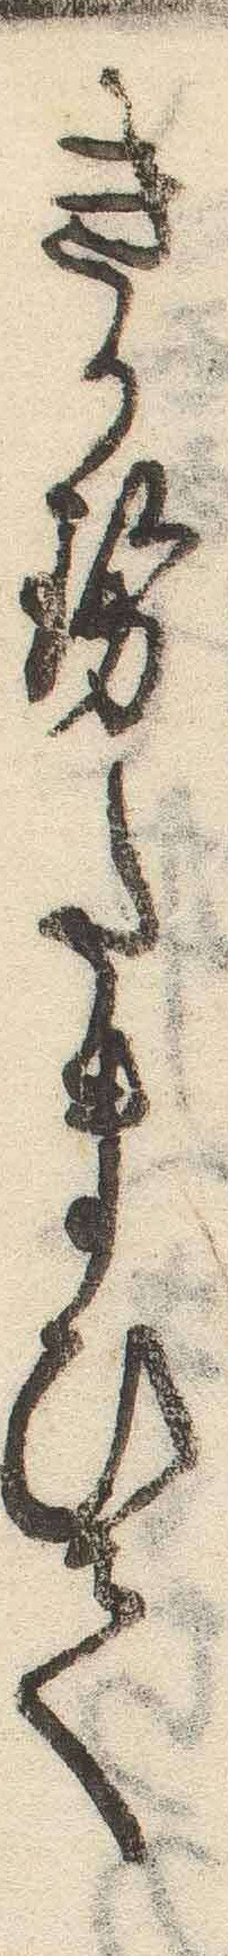きかせたまひて
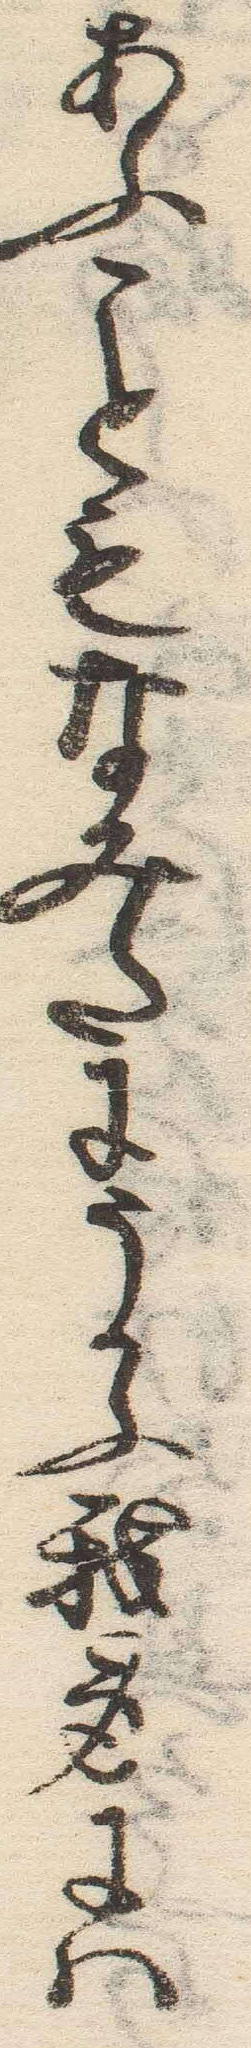あふこともなみたにうかふ我身には
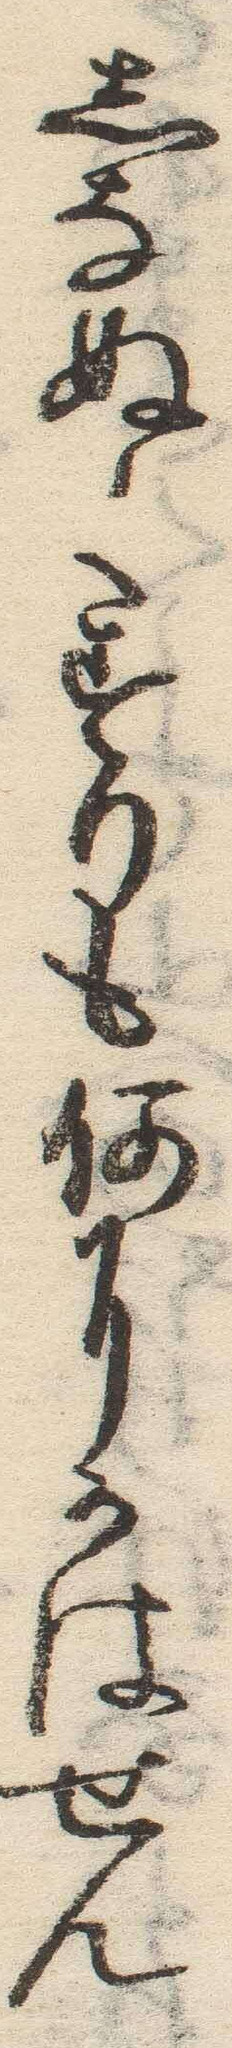しなぬくすりも何にかはせん
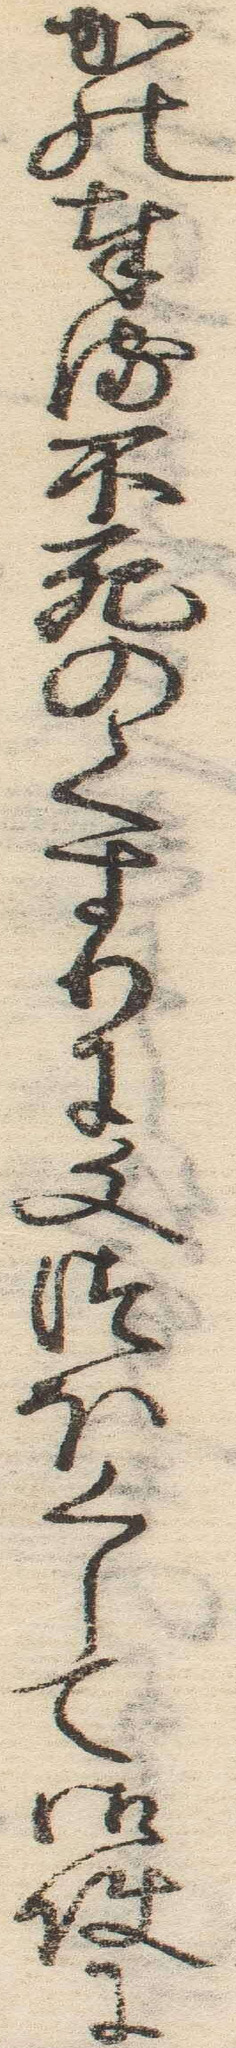かの奉る不死のくすりに文つほくして御使に
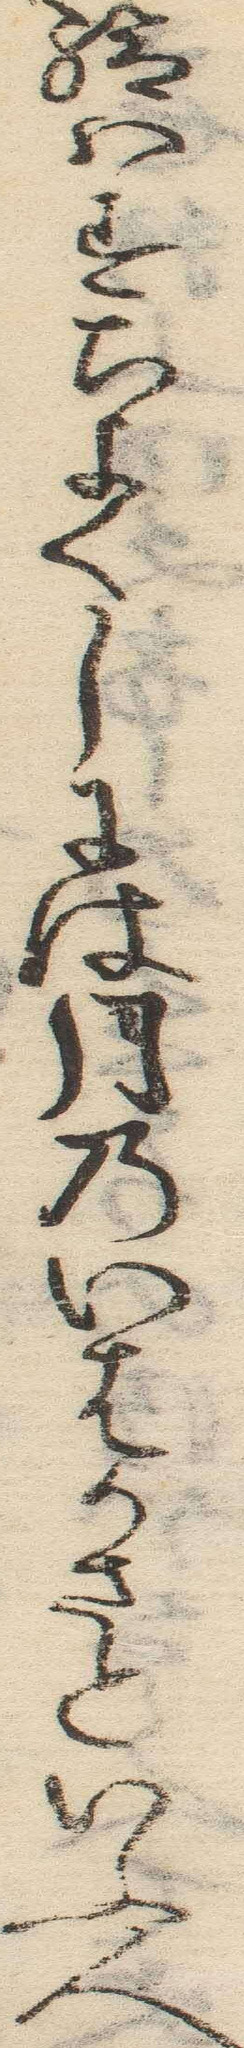給はすちよくしには月のいはかさといふ人
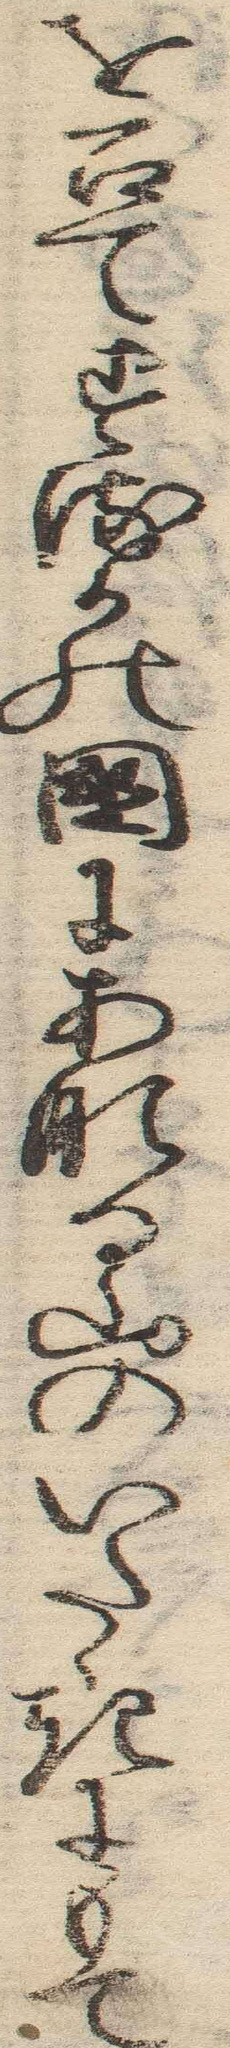を召てするかの国にあなる山のいたゝきにもて

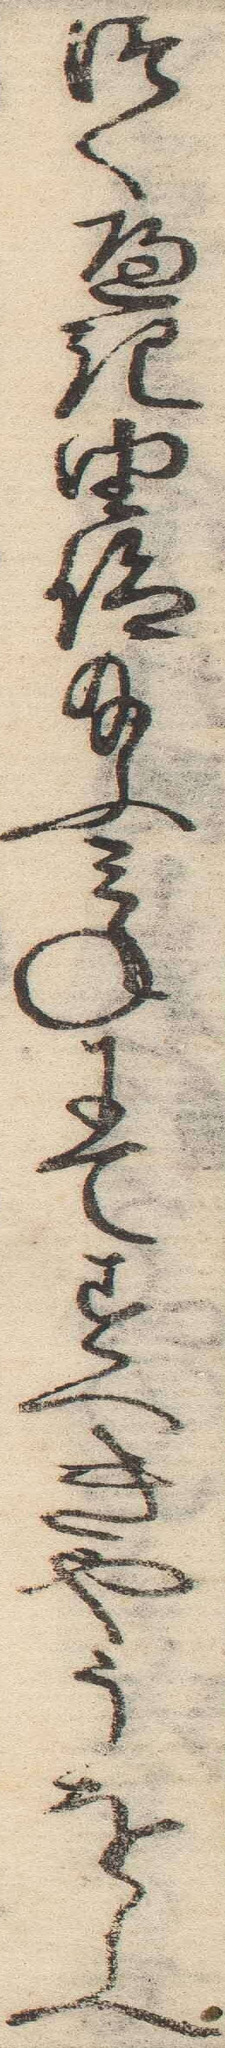つくへき由仰給ふみねにてすへきやうをしへ
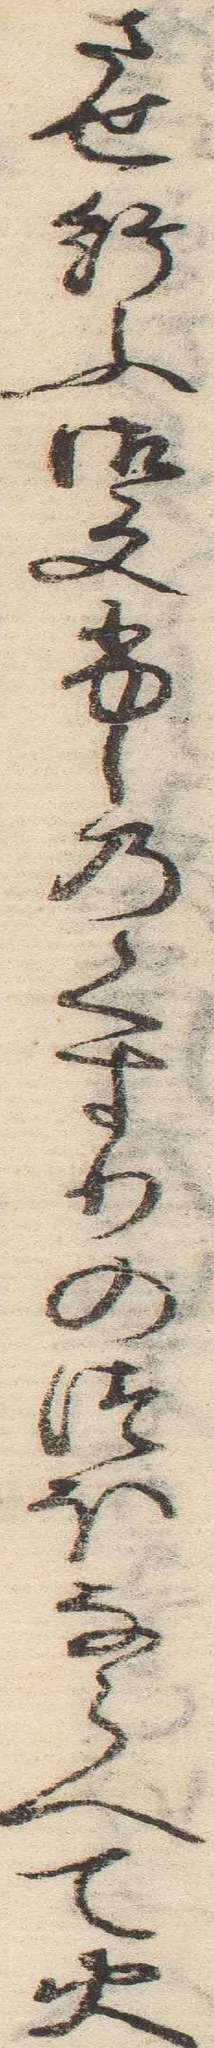させ給ふ御文ふしのくすりのつほならへて火
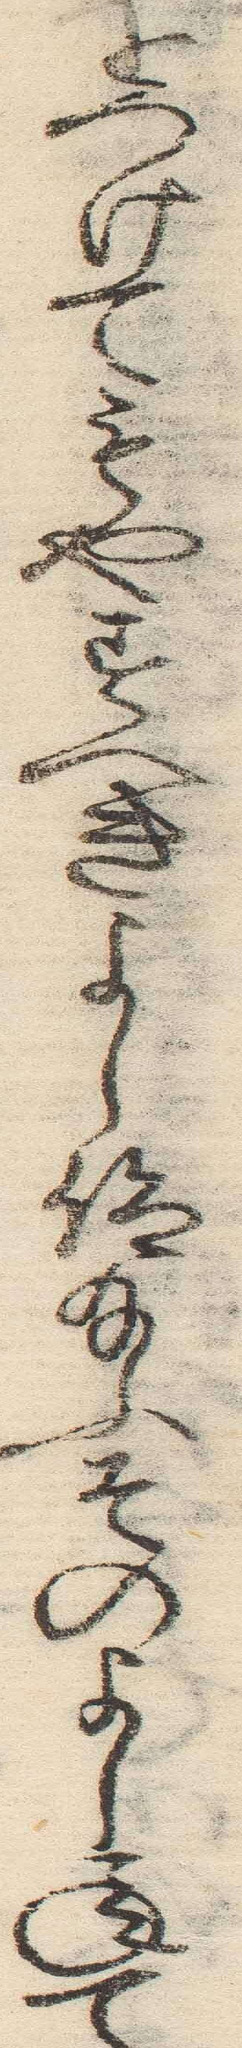をつけてもやすへきよし仰給ふそのよし承て
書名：竹取物語
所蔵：東京学芸大学附属図書館 国文学研究資料館
